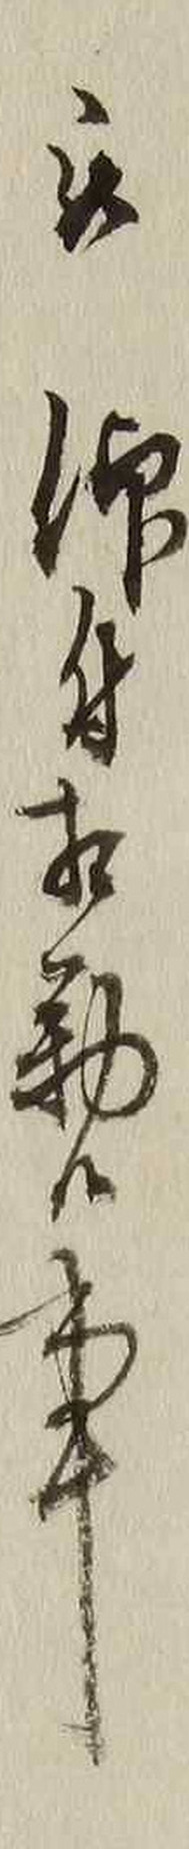被仰付相勤候事
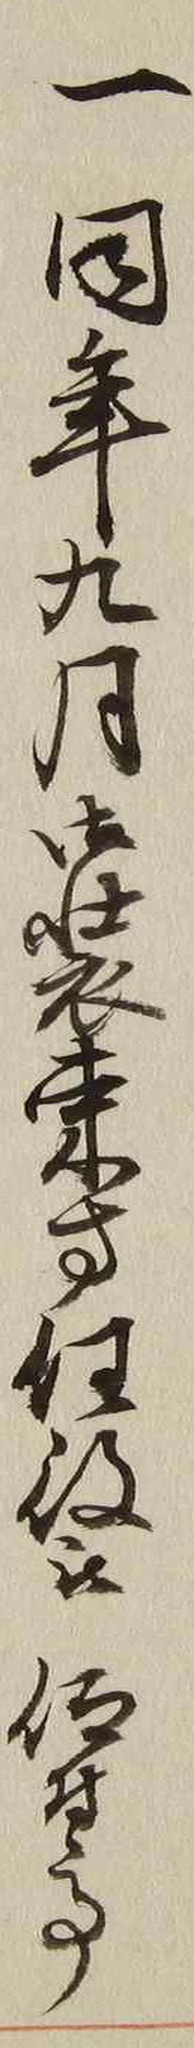一同年九月御装束方任役被仰付候事
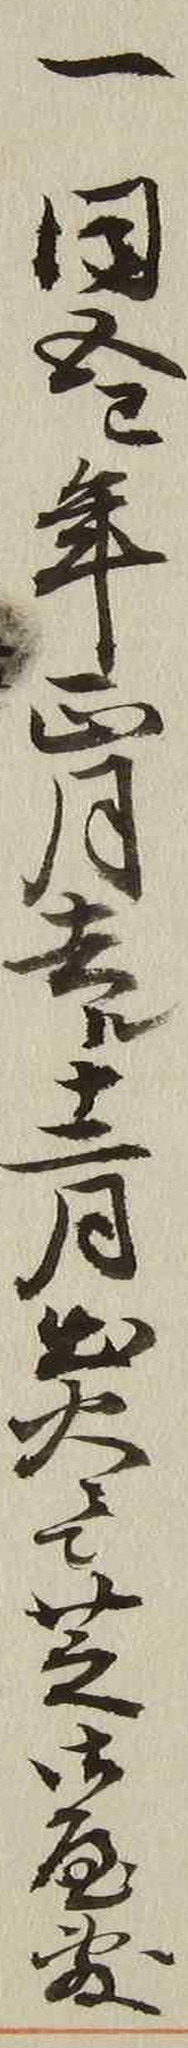一同五巳年正月去ル十二月出火ニて芝御屋敷
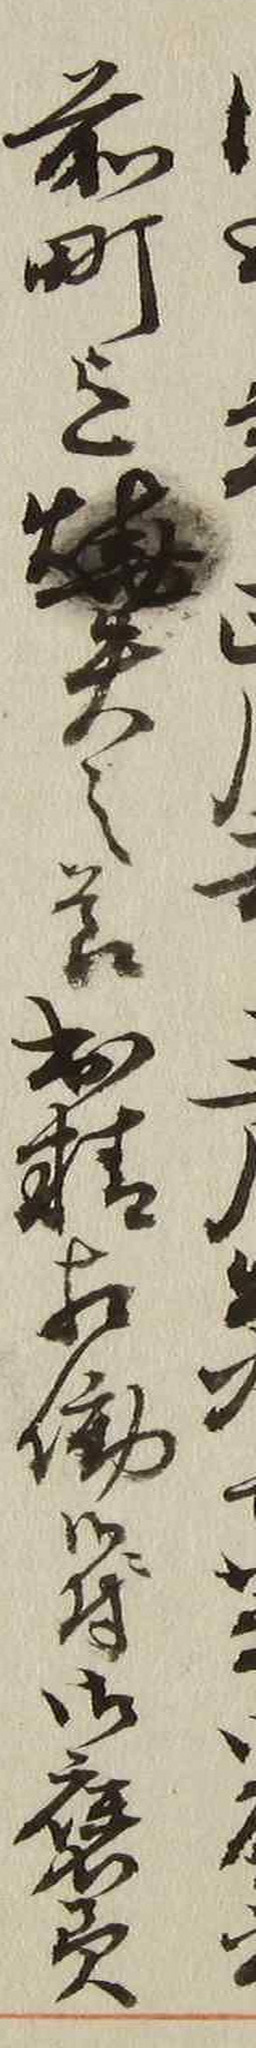前町迄焼失之節出精相働候ニ付御褒美
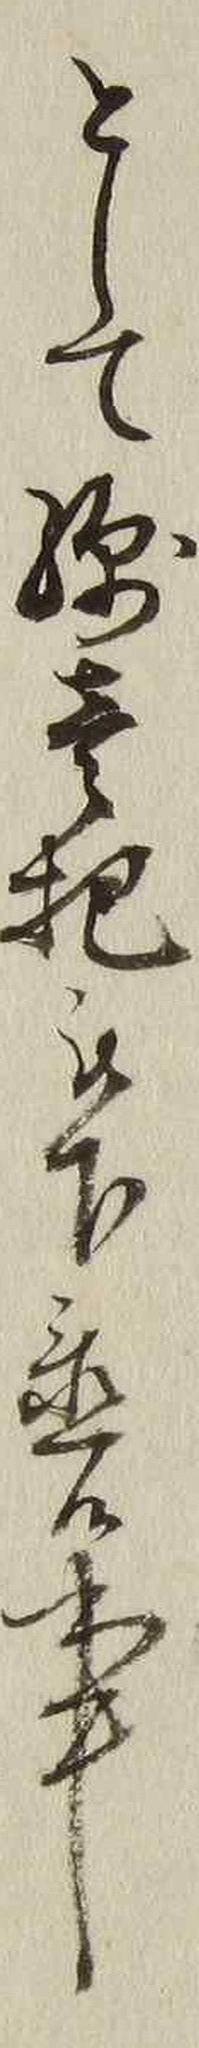として綿壱把被下置候事
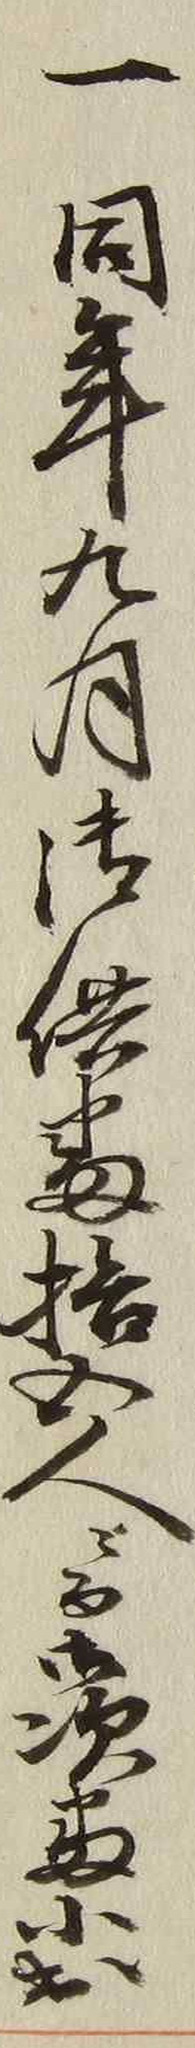一同年九月御供番拾五人ニ而羨御次番小出
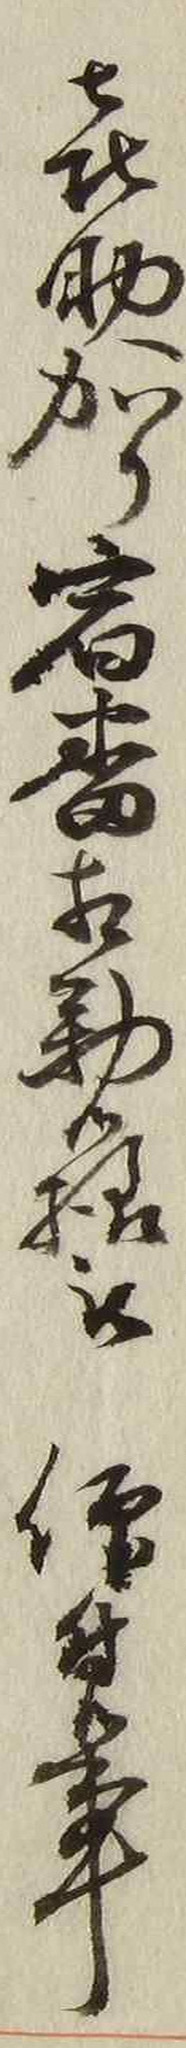喜助へ加り宿番相勤候様被仰付候事
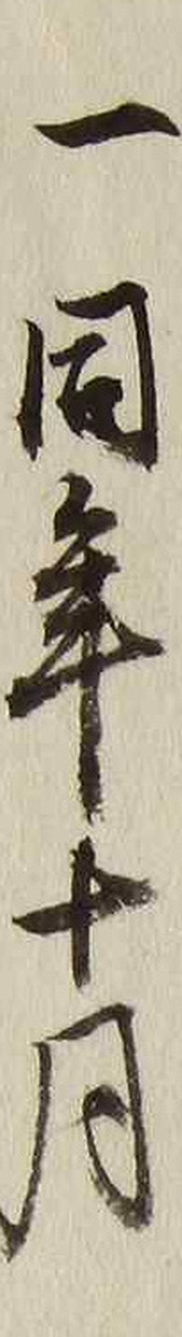一同年十月
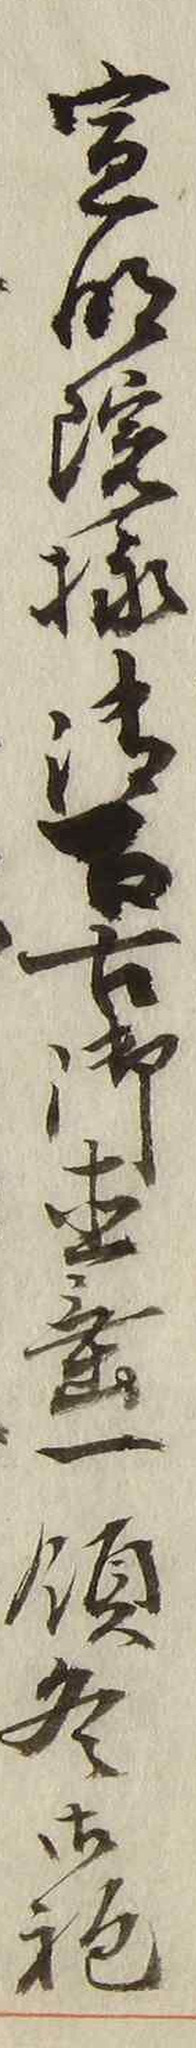宣明院様御召古御直垂一領冬御袍
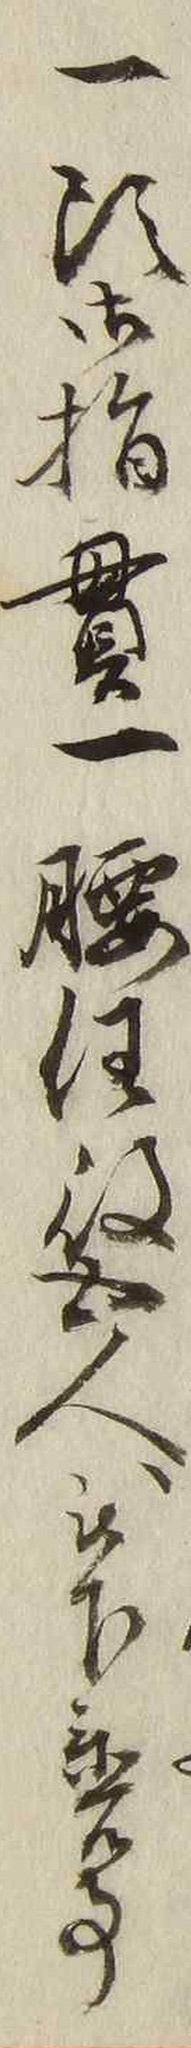一頭御指貫一腰任役五人へ被下置候事

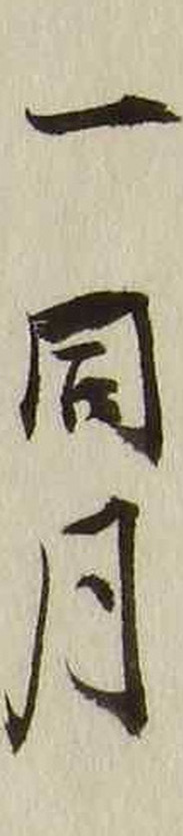一同月
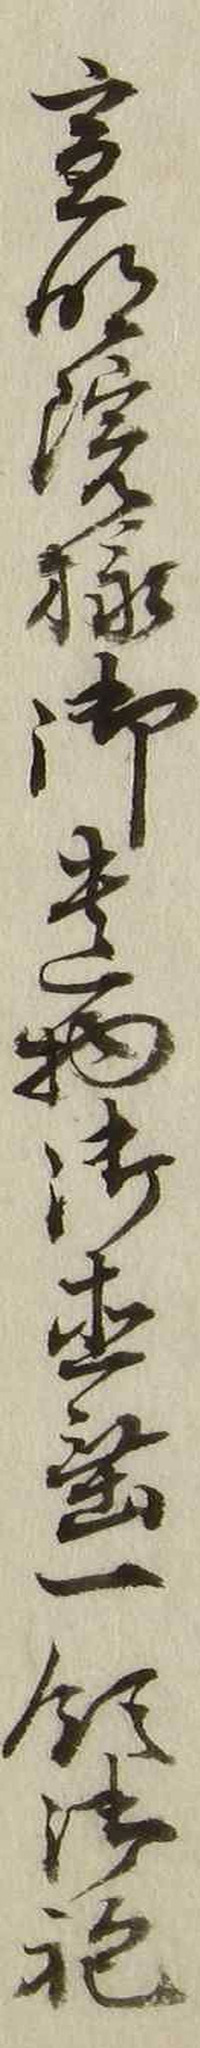宣明院様御遺物御直垂一領御袍
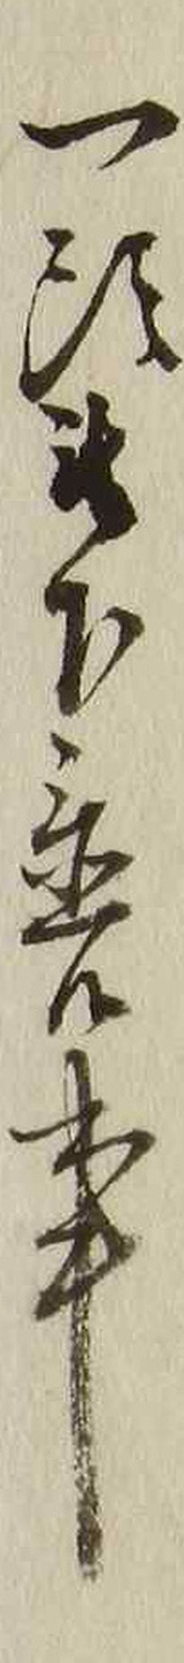一頭被下置候事
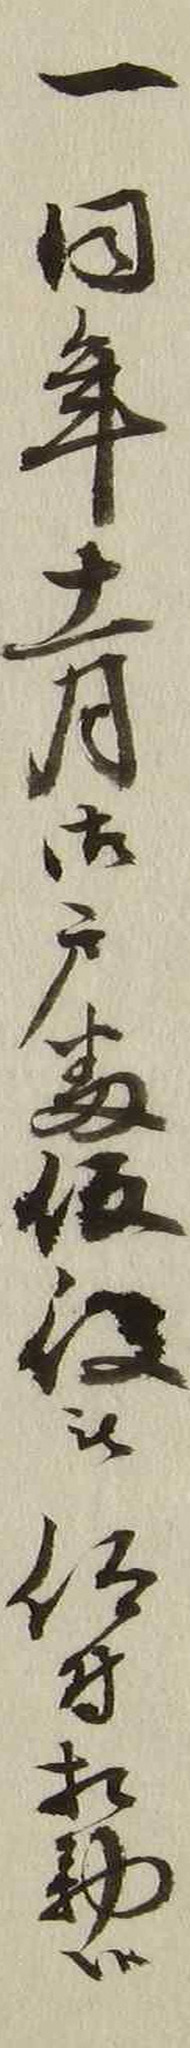一同年十一月御戸番仮役被仰付相勤候
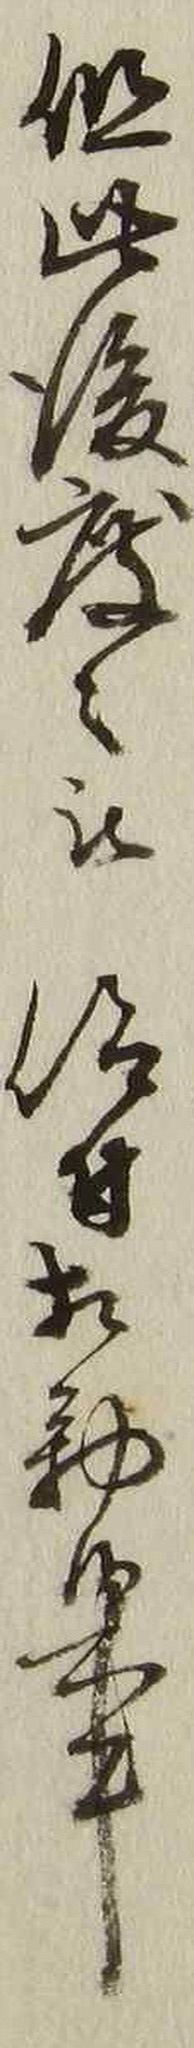但此後度々被仰付相勤候事
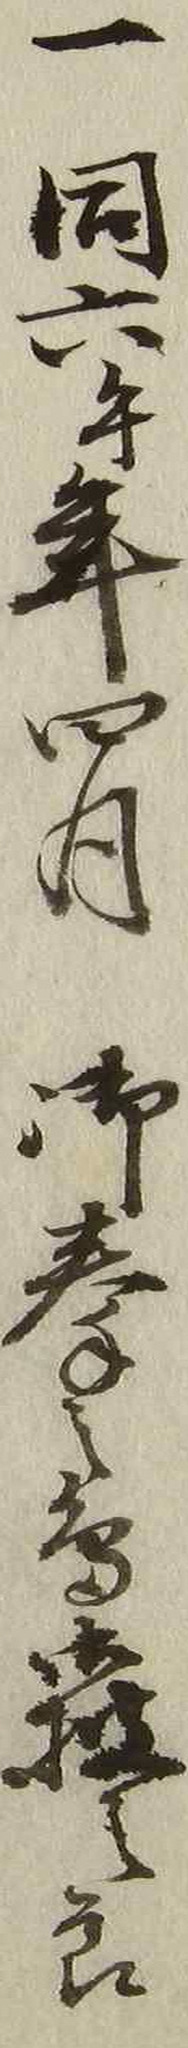一同六午年四月御拳之鳥御披之節
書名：諸士系譜　巻之23　い之部23
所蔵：会津若松市立会津図書館
